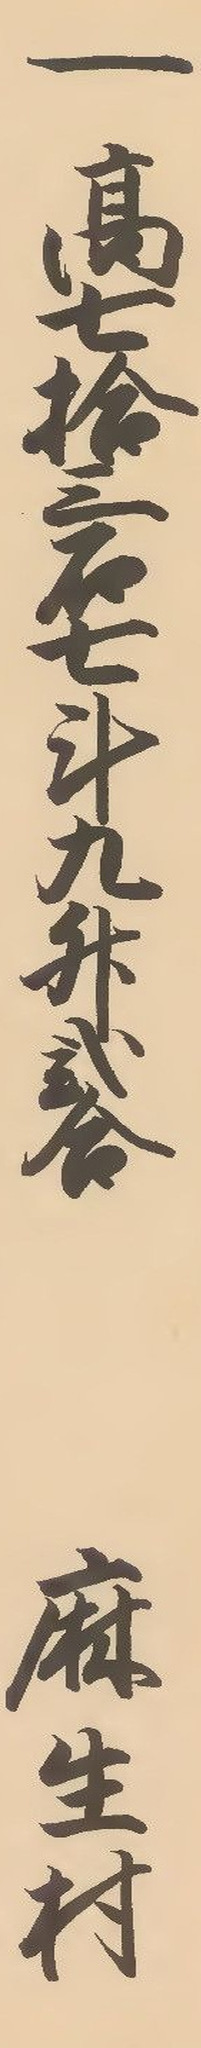一高七拾三石七斗九升弐合麻生村
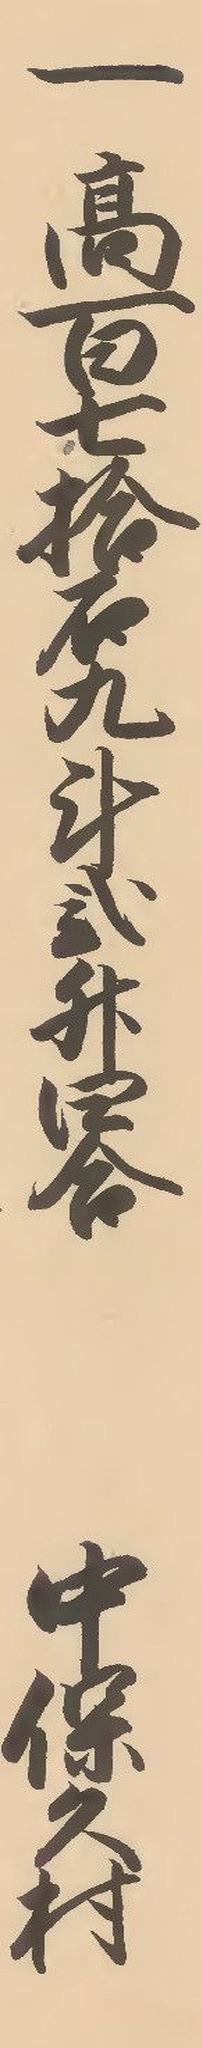一高百七拾石九斗弐升四合中保久村
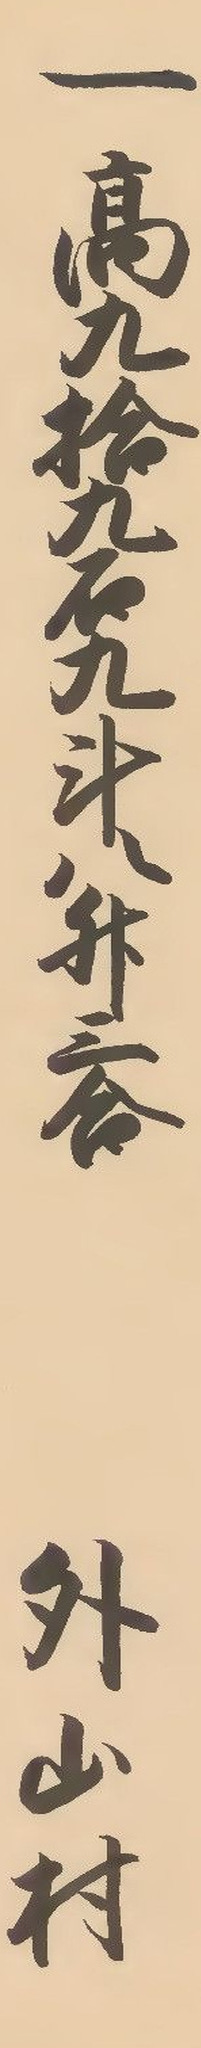一高九拾九石九斗八升三合外山村
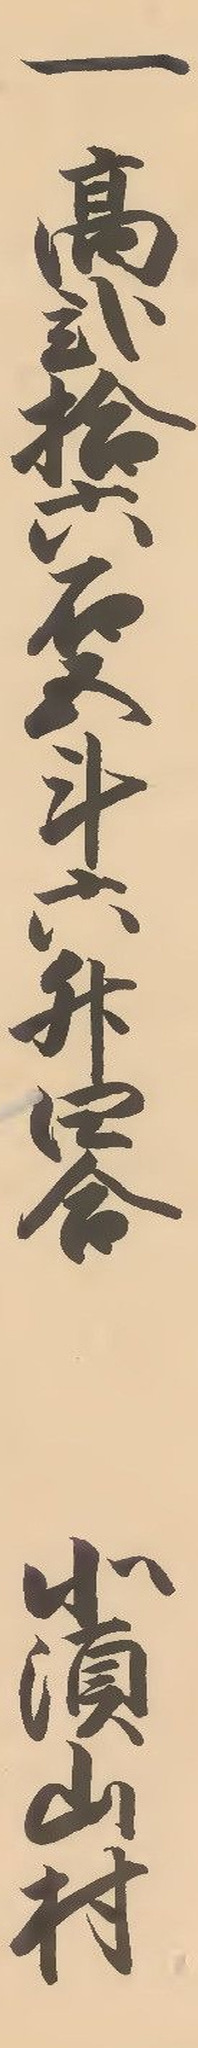一高弐拾六石五斗六升四合北須山村
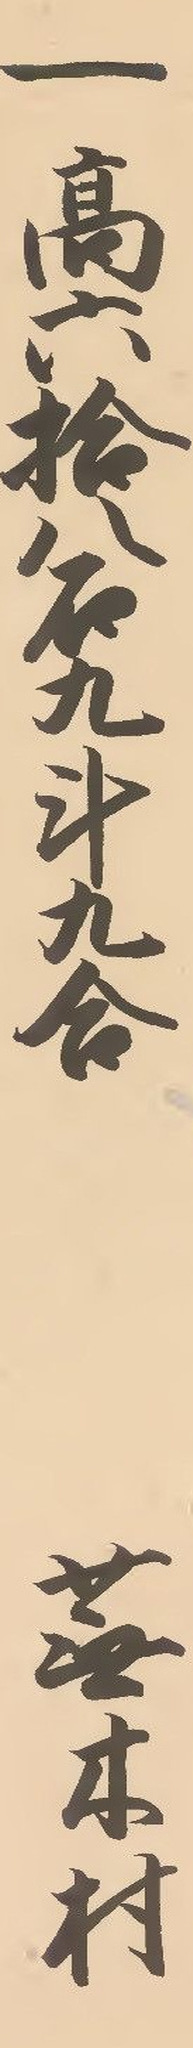一高六拾八石九斗九合蕪木村
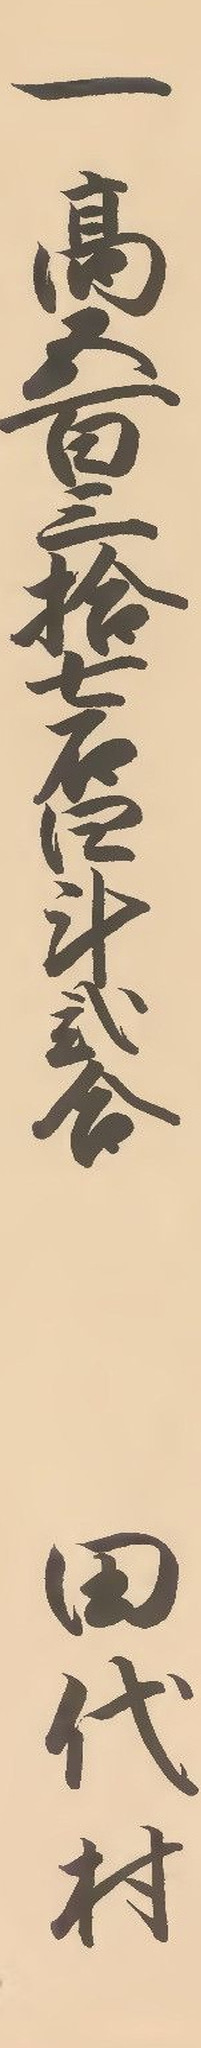一高五百三拾七石四斗弐合田代村
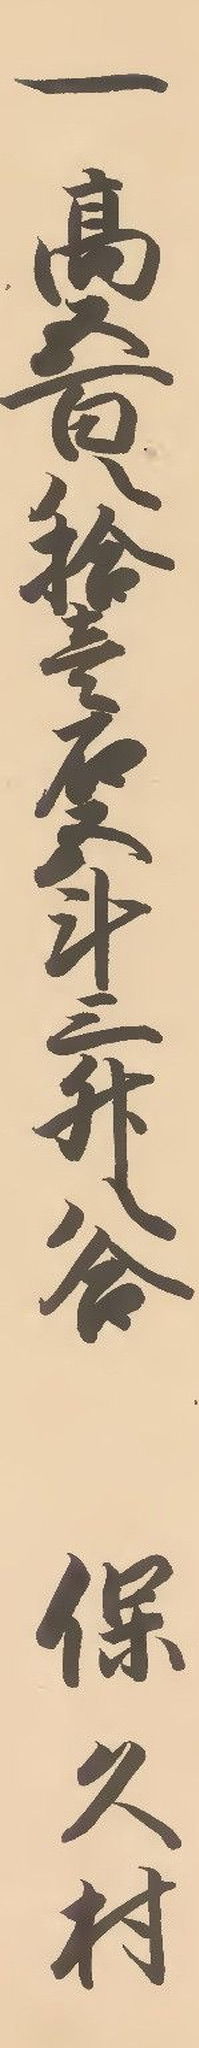一高五百八拾壱石五斗三升八合保久村
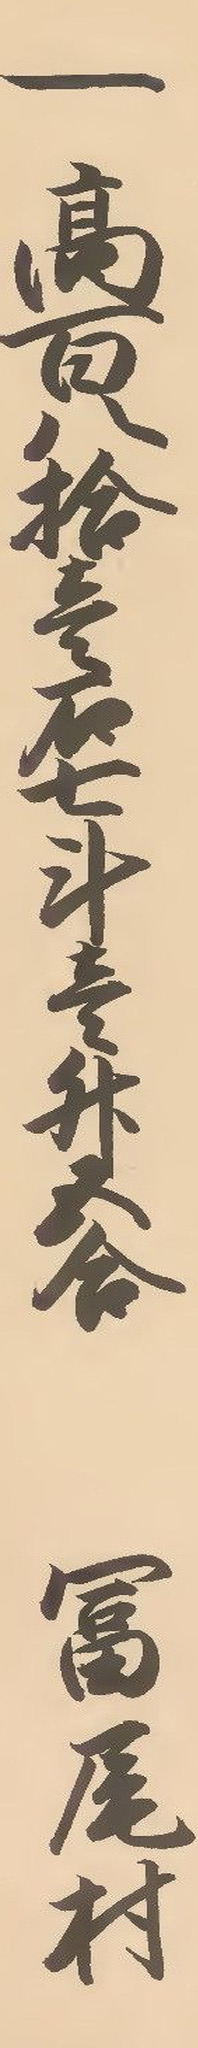一高百八拾壱石七斗壱升五合富尾村

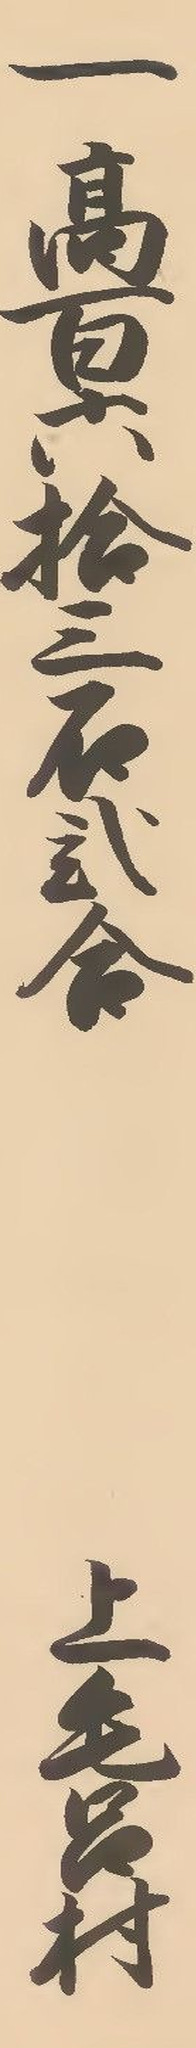一高百六拾三石弐合上毛呂村
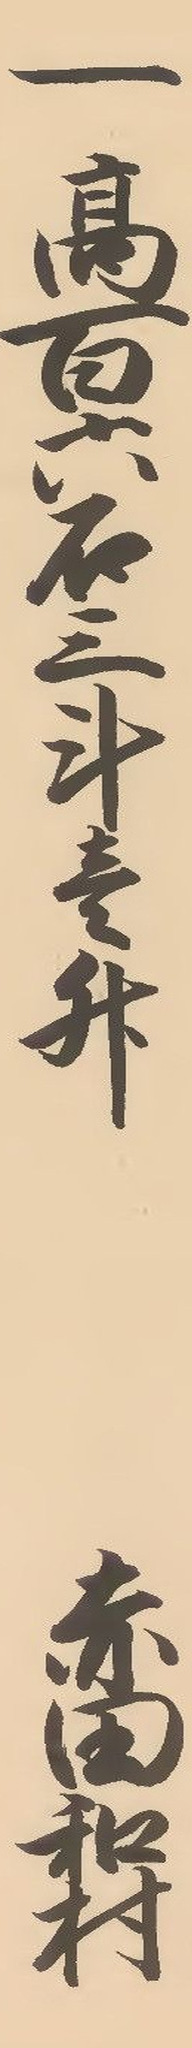一高百六石三斗壱升赤田和村
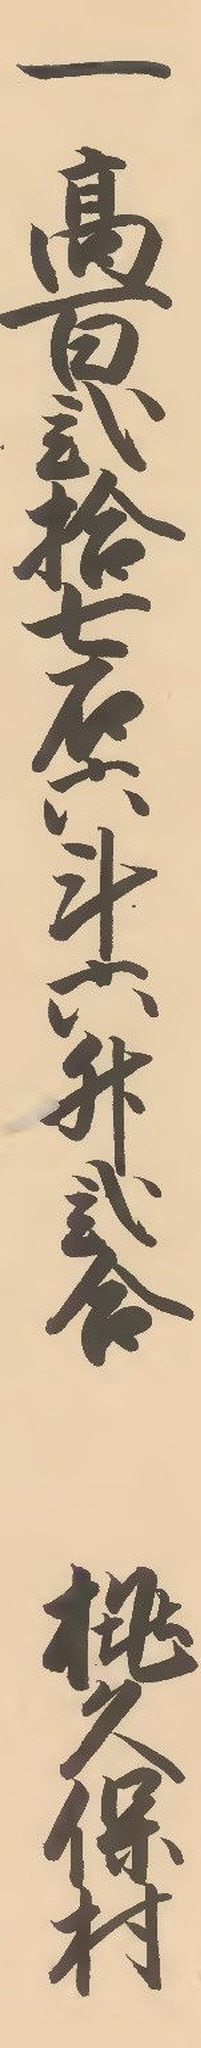一高百弐拾七石六斗六升弐合桃久保村
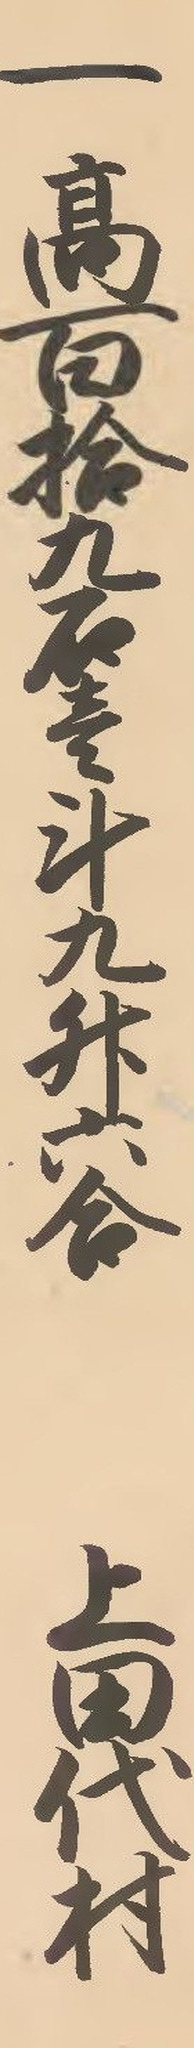一高百拾九石壱斗九升六合上田代村
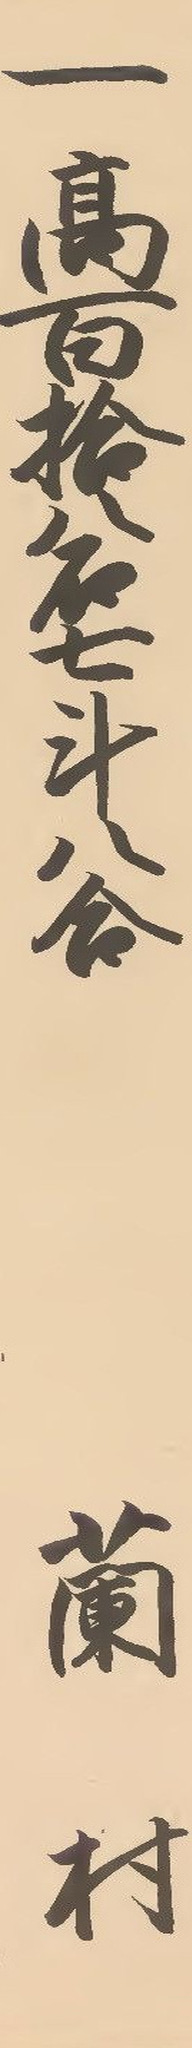一高百拾八石七斗八合蘭村
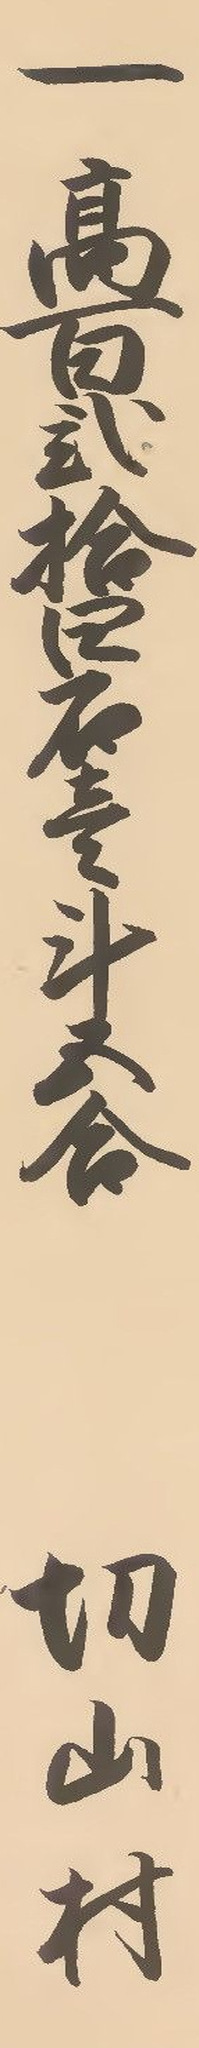一高百弐拾四石壱斗五合切山村
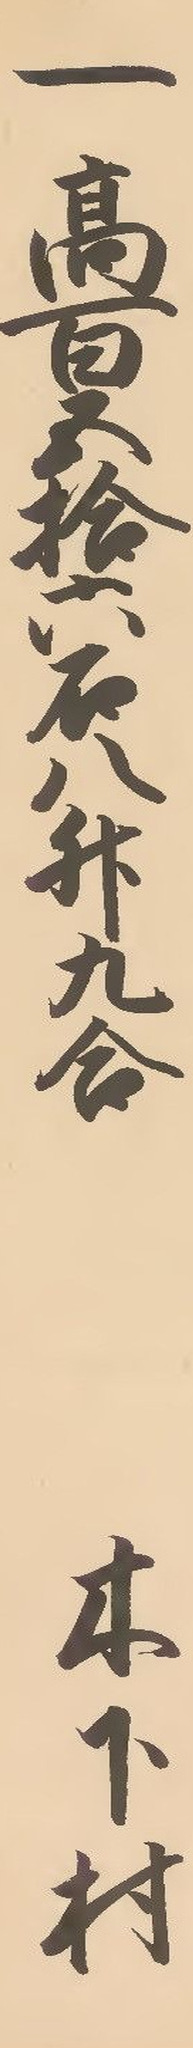一高百五拾六石八升九合木下村

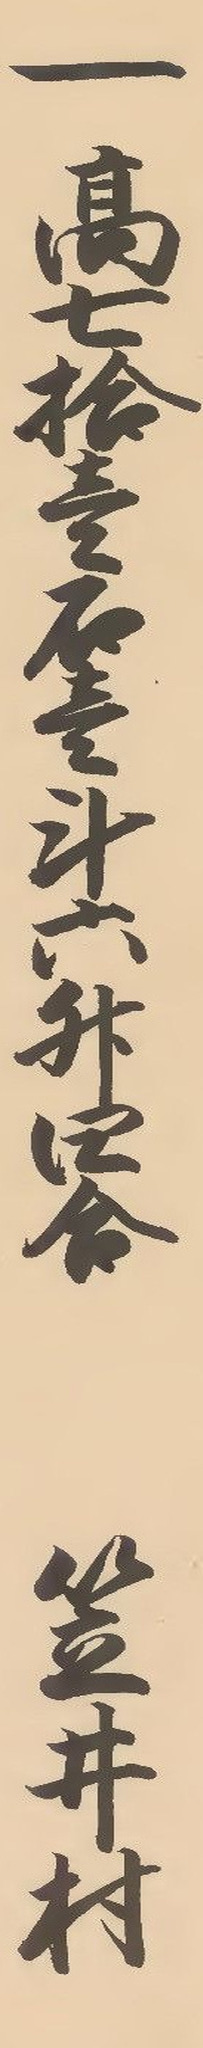一高七拾壱石壱斗六升四合笠井村
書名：三河国郷帳
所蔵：国立公文書館 National Archives of Japan
